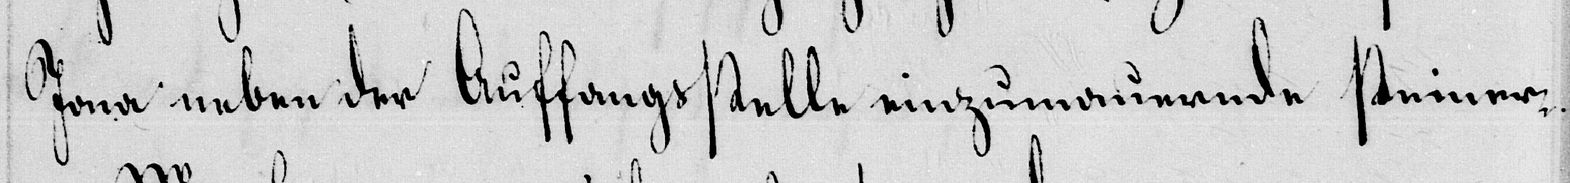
Jona neben der Auffangstelle einzumauernde steiner¬
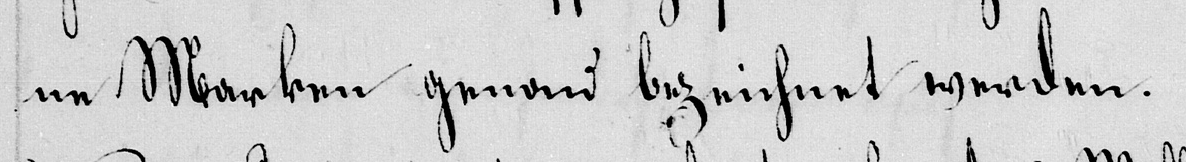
ne Marken genau bezeichnet werden.
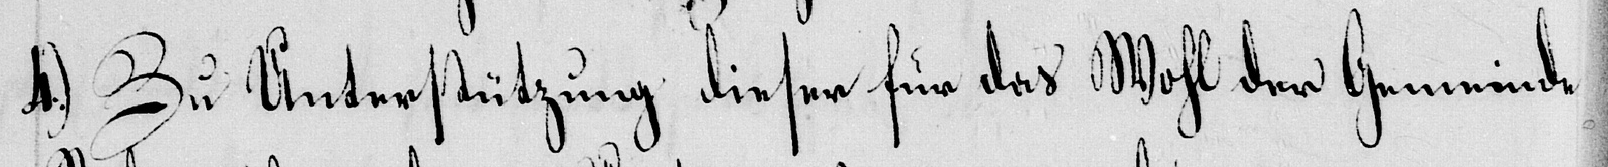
4.) Zu Unterstützung dieser für das Wohl der Gemeinde
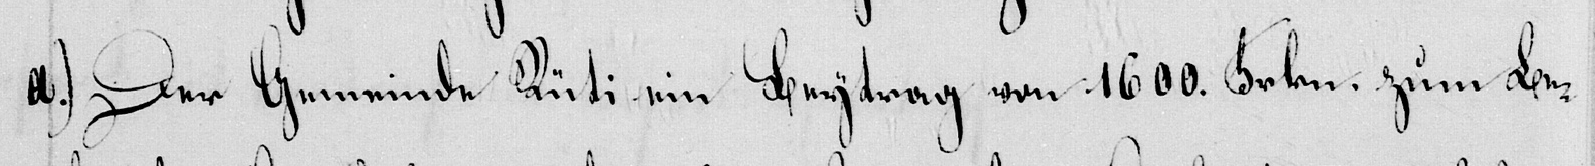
a.) Der Gemeinde Rüti ein Beytrag von 1600. Frkn. zum Be¬
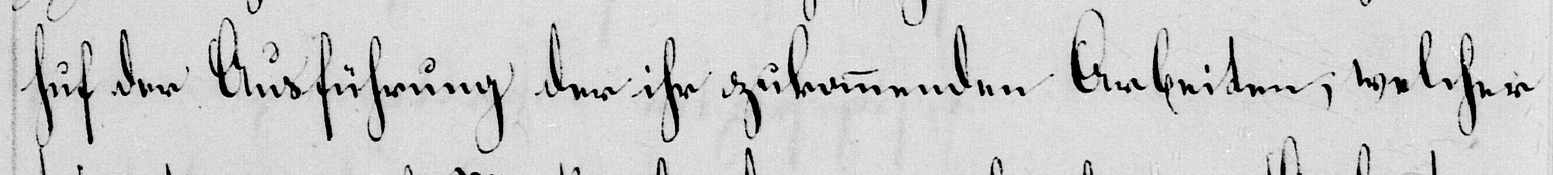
huf der Ausführung der ihr zukommenden Arbeiten; welcher
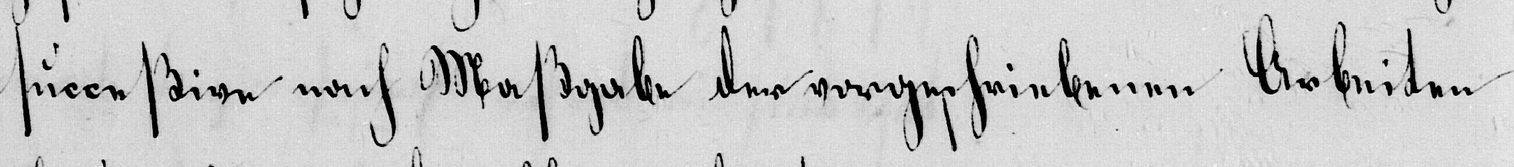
succeßive nach Maßgabe der verschiedenen Arbeiten
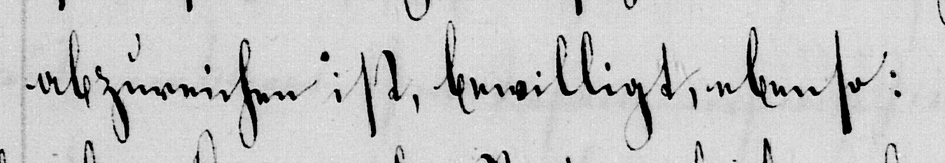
abzureichen ist, bewilligt, ebenso:
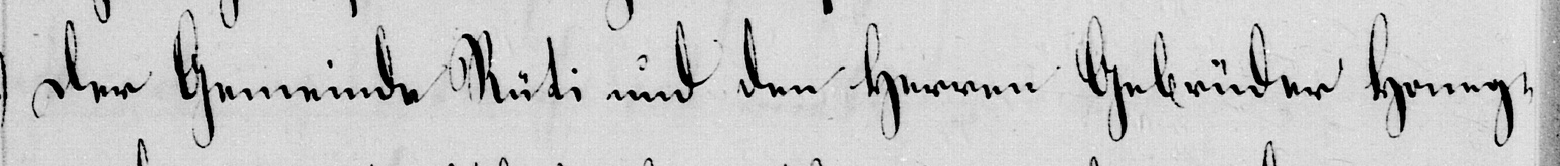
Der Gemeinde Rüti und den Herren Gebrüder Honeg¬
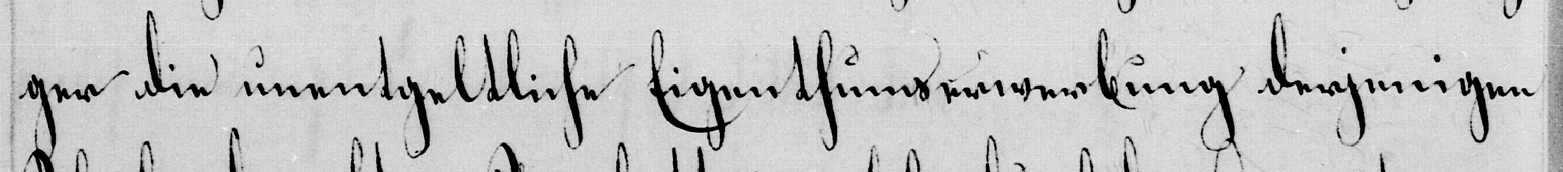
ger die unentgeldliche Eigenthumserwerbung derjenigen
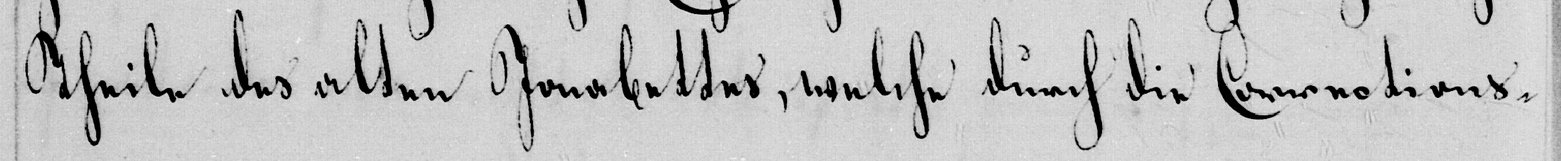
Theile des alten Jonabettes, welche durch die Corrections-
